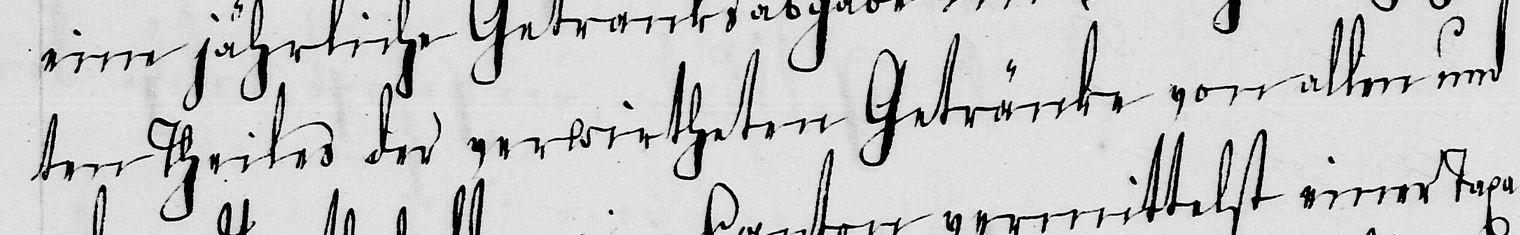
ten Theiles der verwirtheten Getränke von allen und
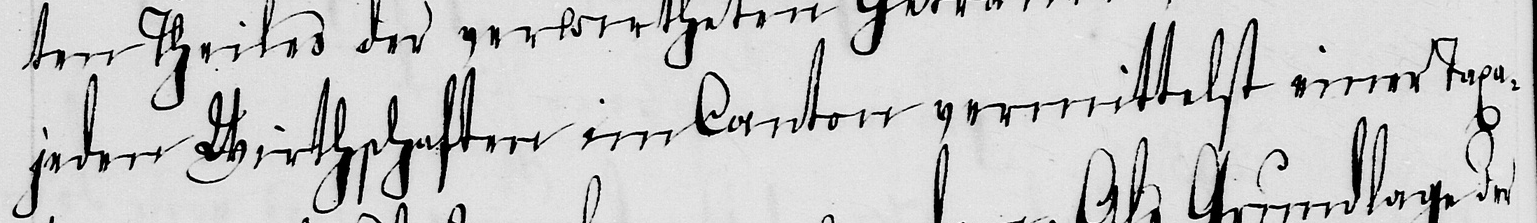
jeden Wirtschaften im Canton vermittelst einer Taxa¬
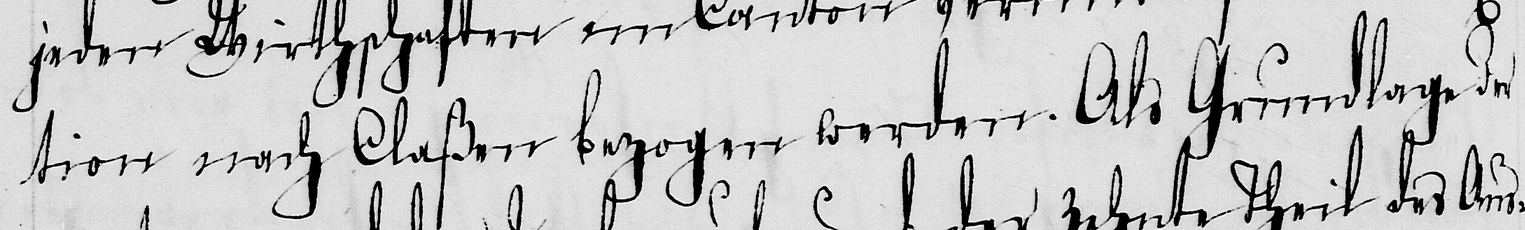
tion nach Claßen bezogen werden. Als Grundlage der
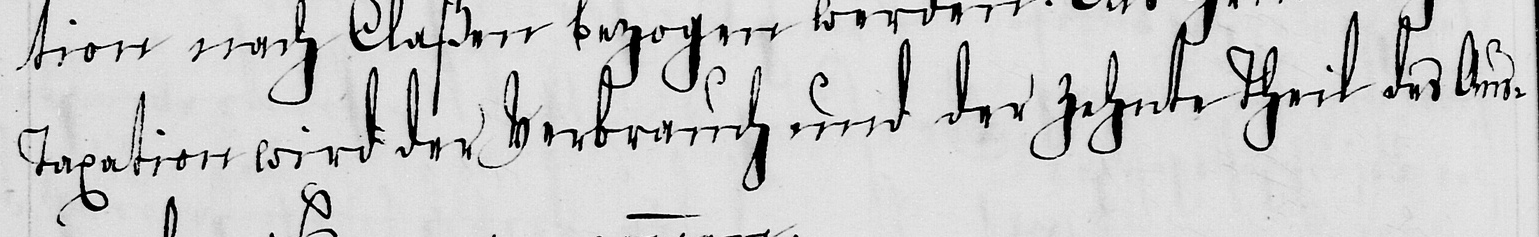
Taxation wird der Verbrauch und der zehnte Theil des Aus¬
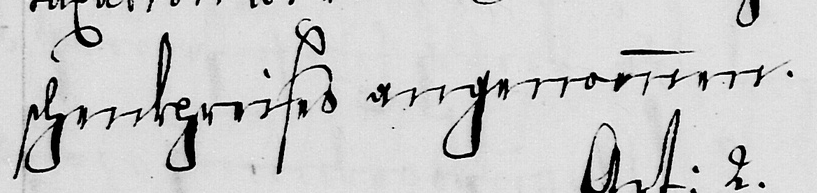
schenkpreises angenommen.
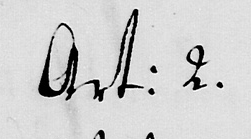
Art: 2.
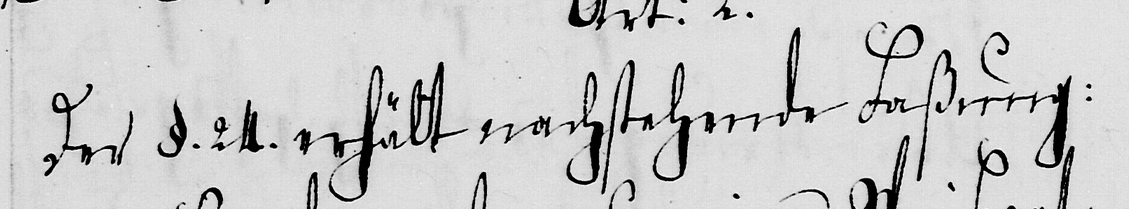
Der §. 24. erhält nachstehende Faßung:
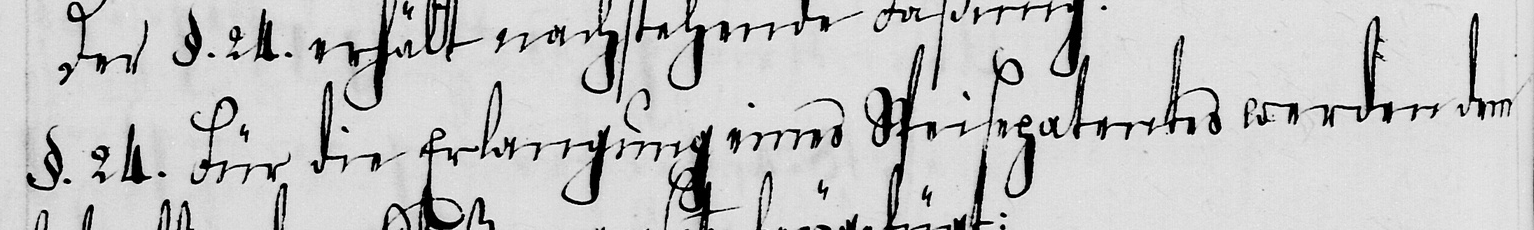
§. 24. Für die Erlangung eines Speisepatentes werden dem
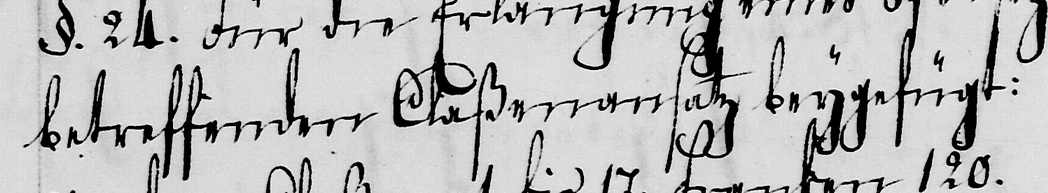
betreffenden Claßenansatz beygefügt:
